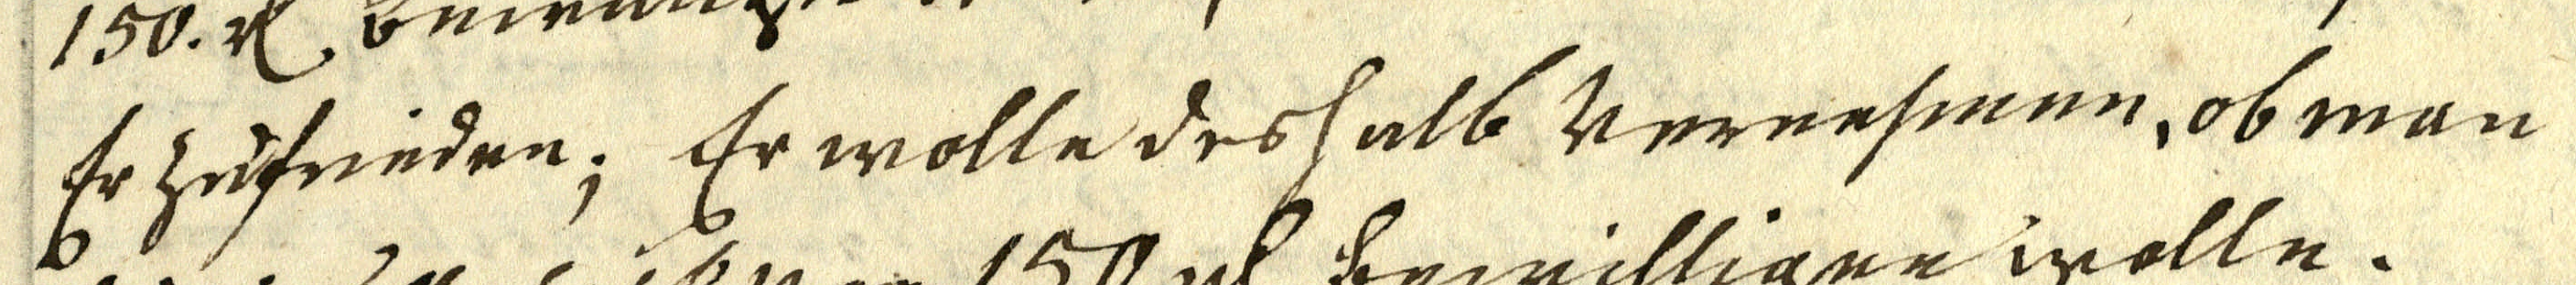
Er zufrieden; Er wolle deshalb vernehmen, ob man
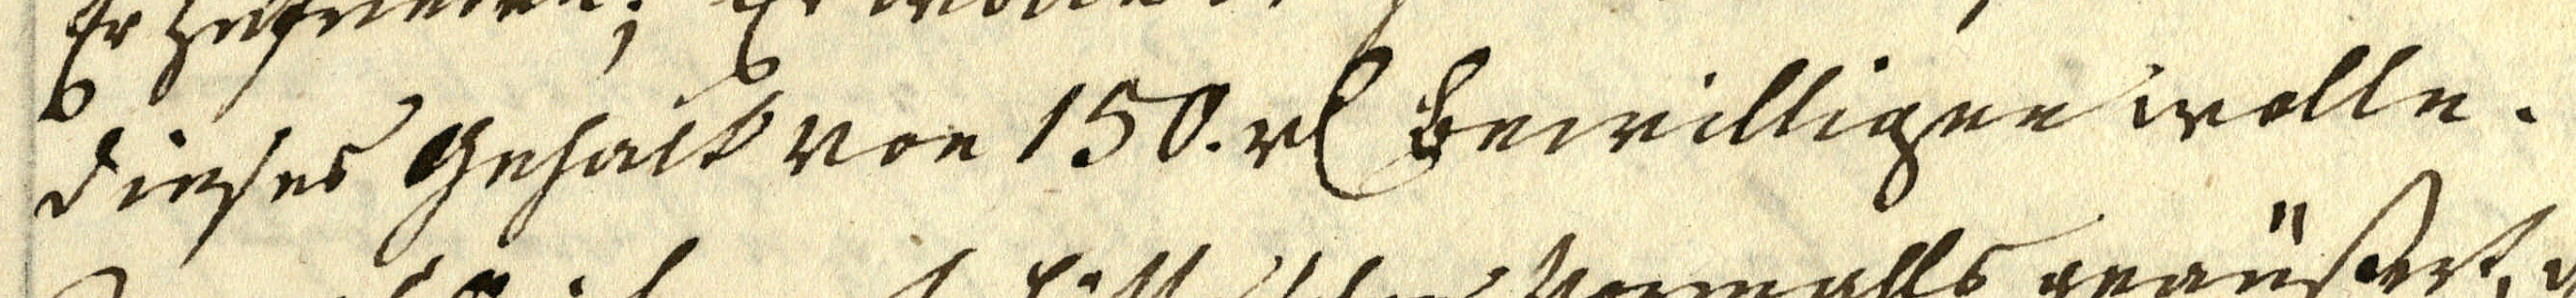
dieses Gehalt von 150 r bewilligen wolle.
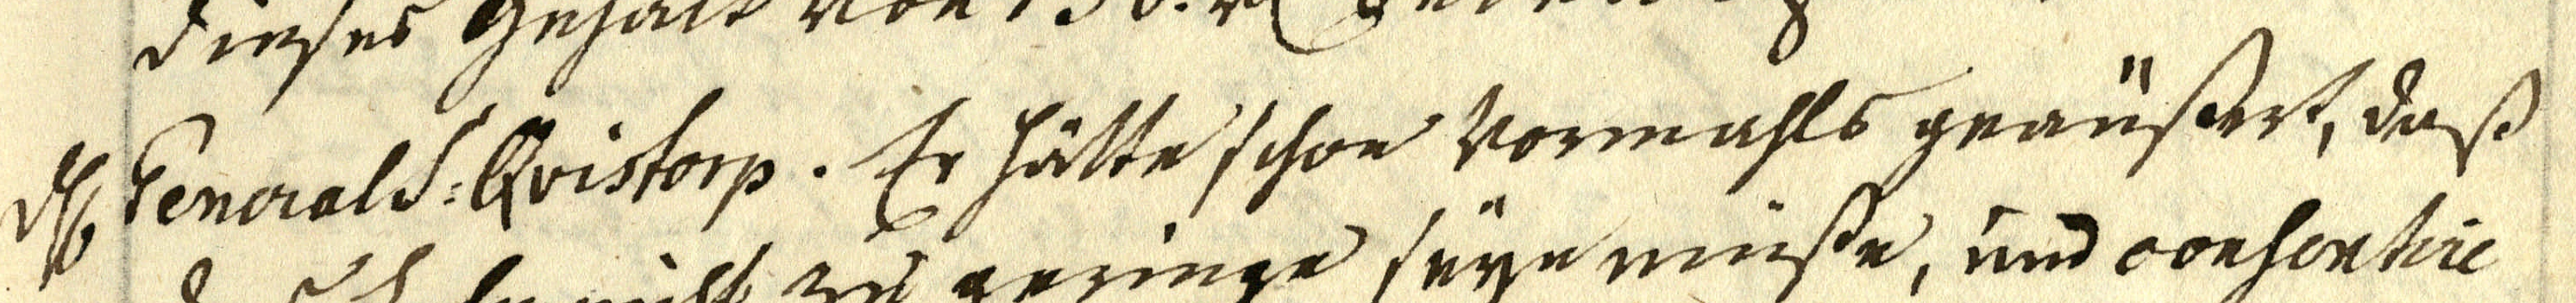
dh GeneralS. Quistorp. Er hätte schon vormahls geäußert, daß
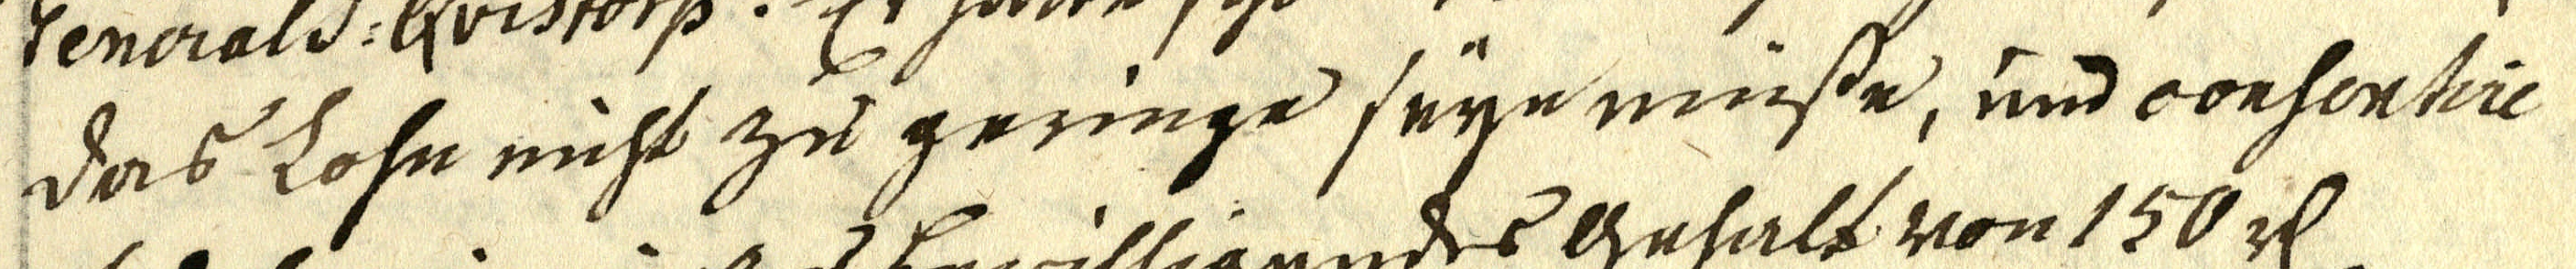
das Lohn nicht zu geringe seÿn müße, und consentire
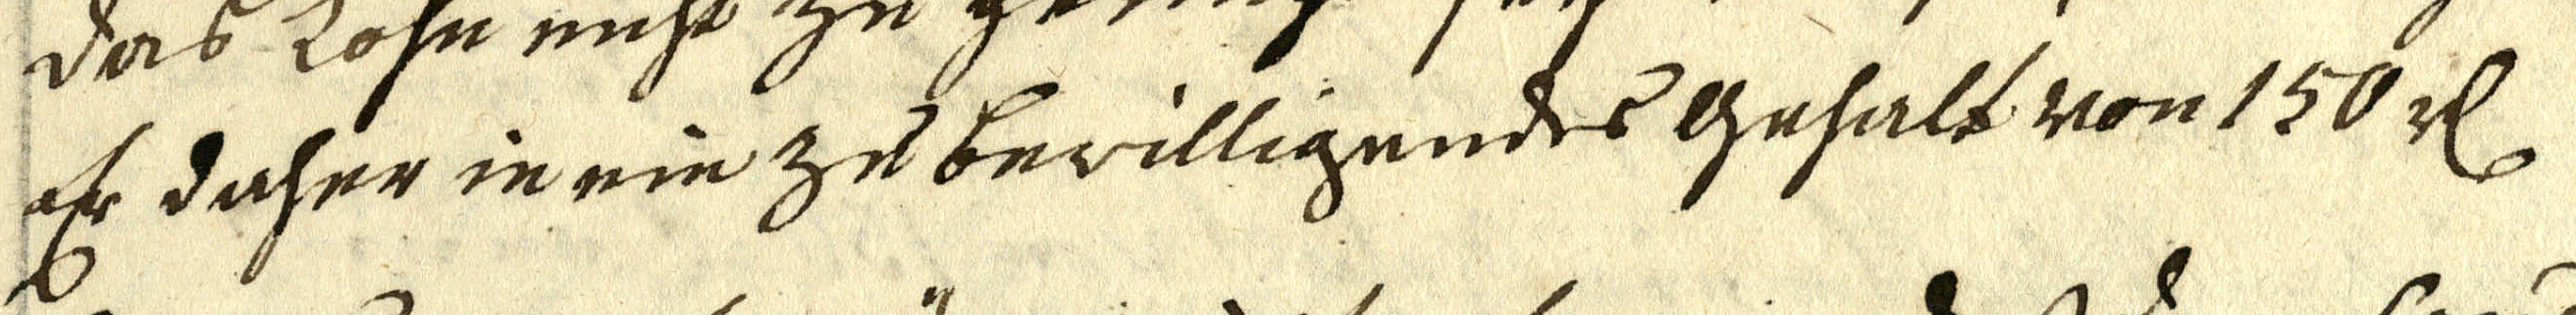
Er daher in ein zu bewilligendes Gehalt von 150 r
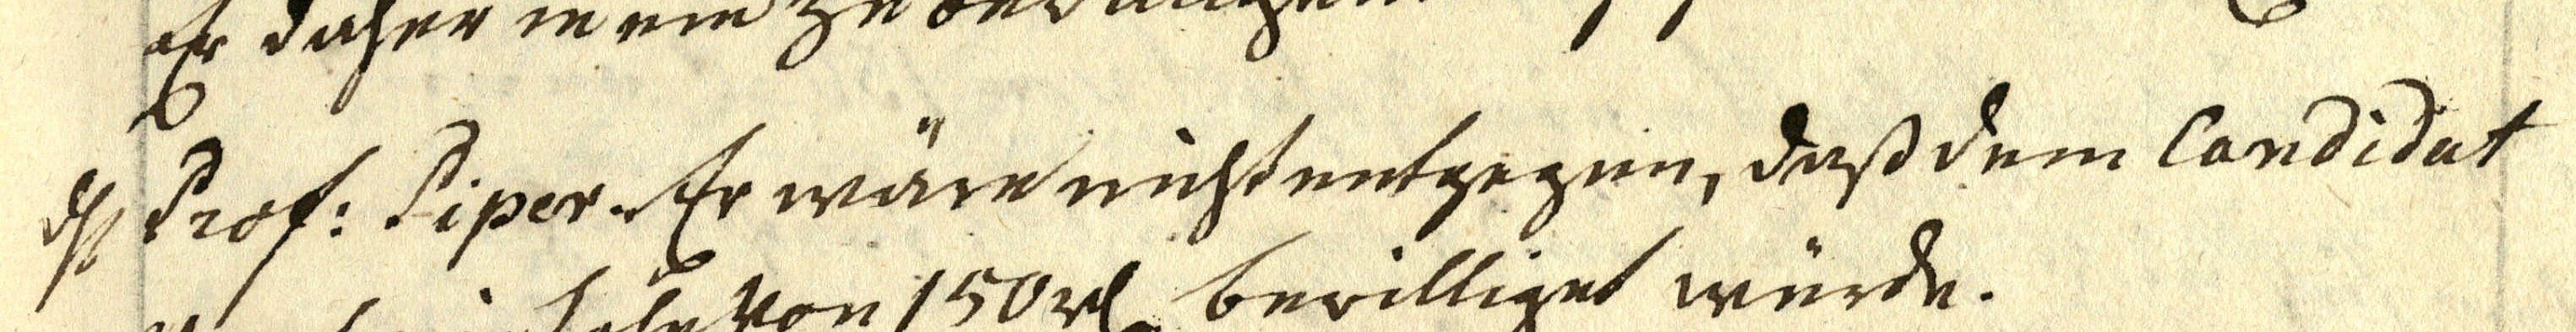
dh Prof. Piper. Er wäre nicht entgegen, daß dem Candidat
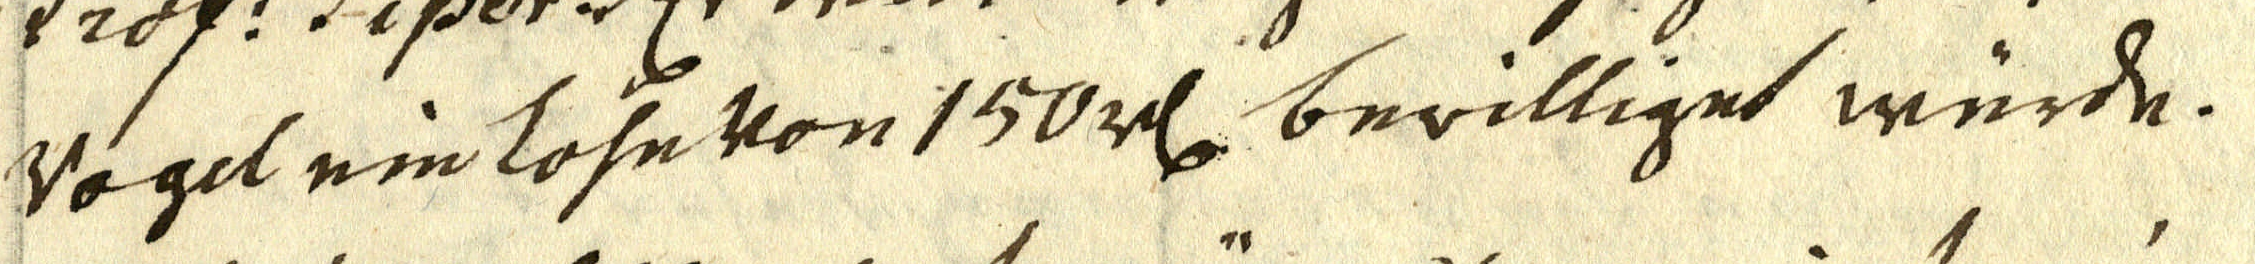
Vogel ein Lohn von 150 r. bewilliget würde.
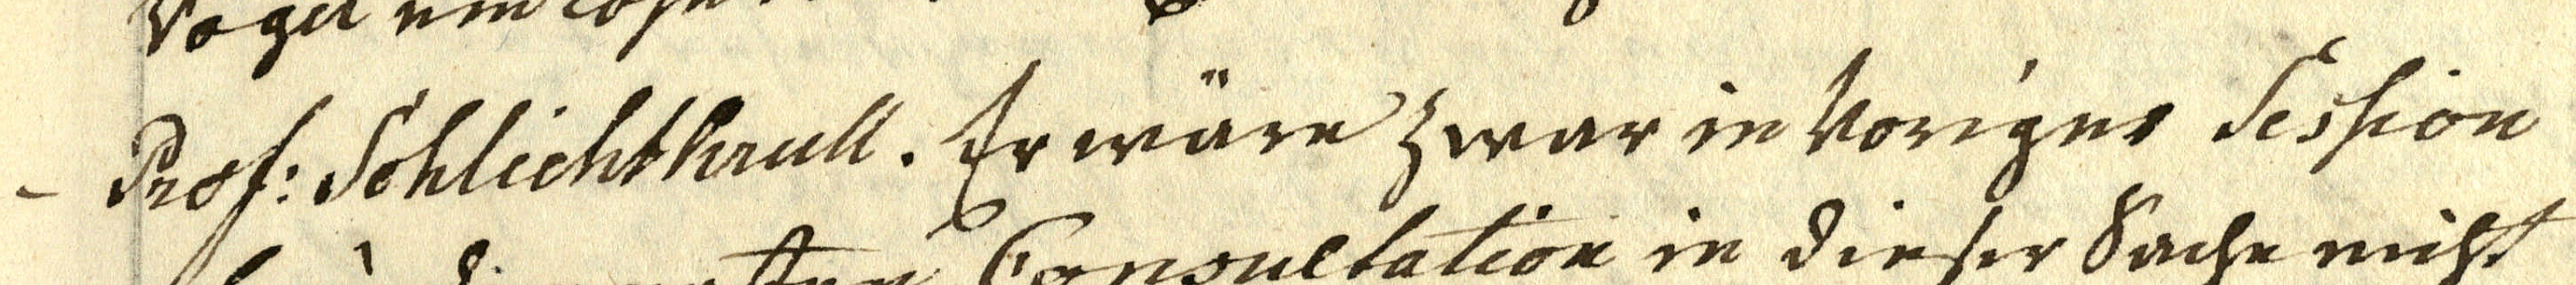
Prof. Schlichtkrull. Er wäre zwar in voriger Session
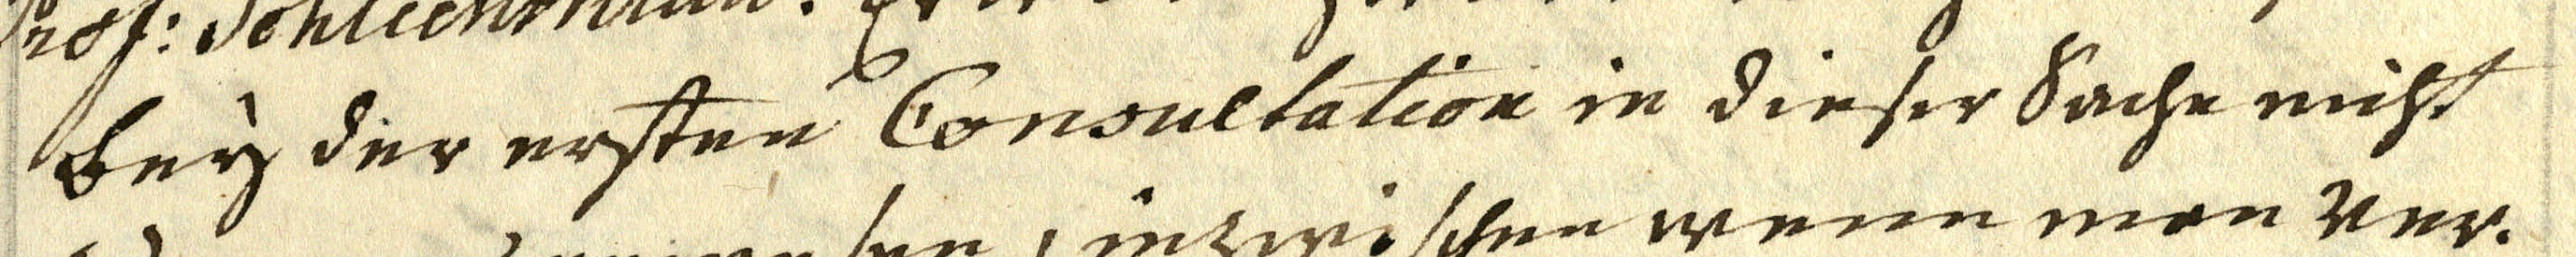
beÿ der ersten Consultation in dieser Sache nicht
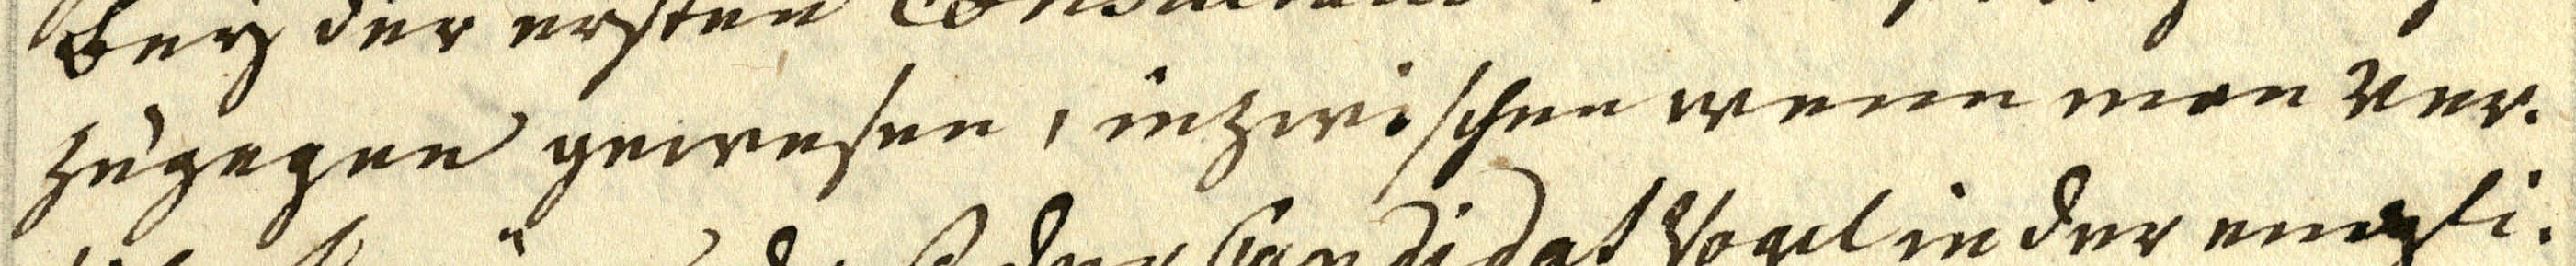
zugegen gewesen, inzwischen wenn man ver¬
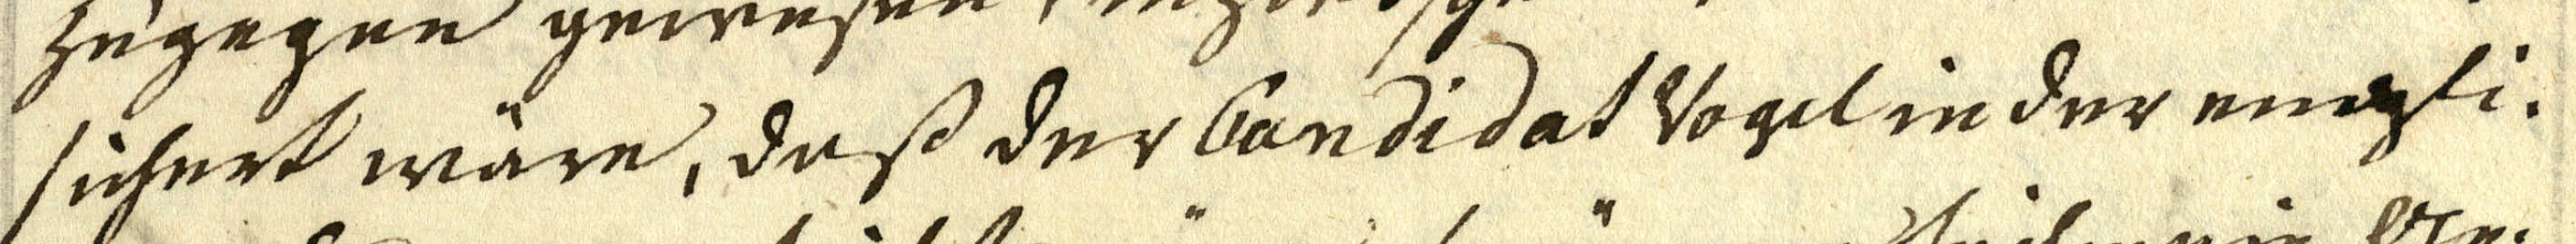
sichert wäre, daß der Candidat Vogel in der engli¬
